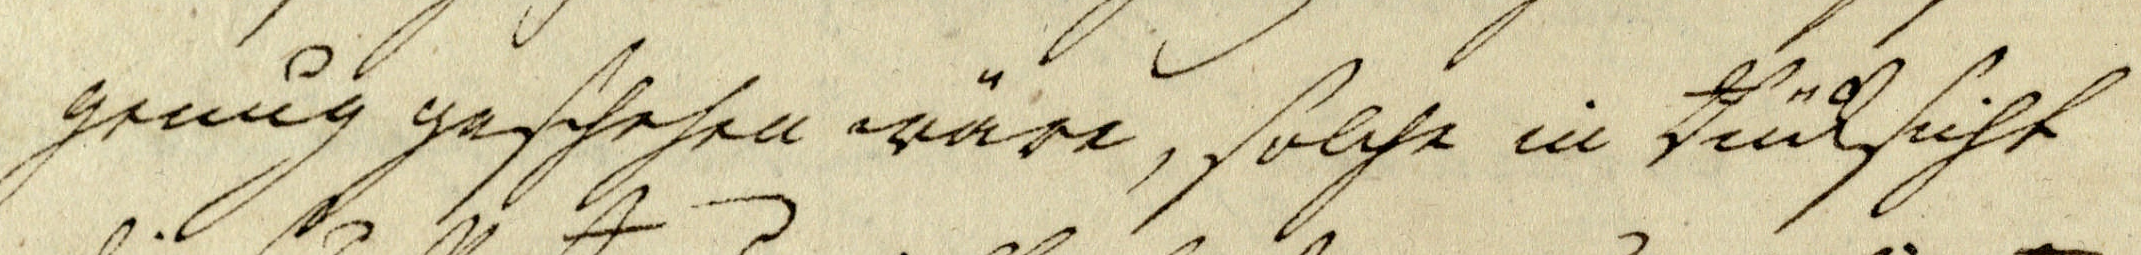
genug geschehen wäre, solche in Rücksicht
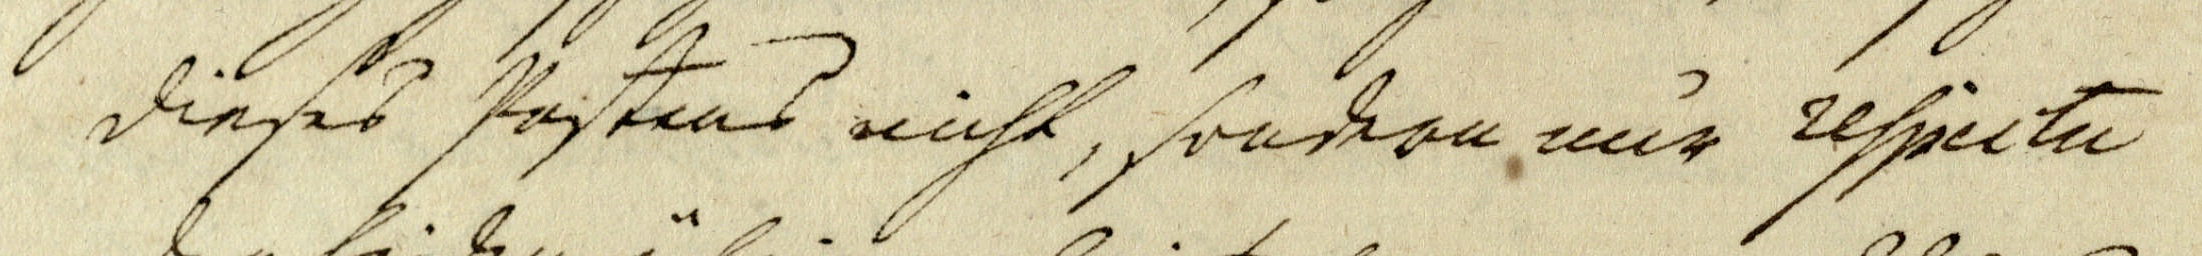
dieses Postens nicht, sondern nur respectu
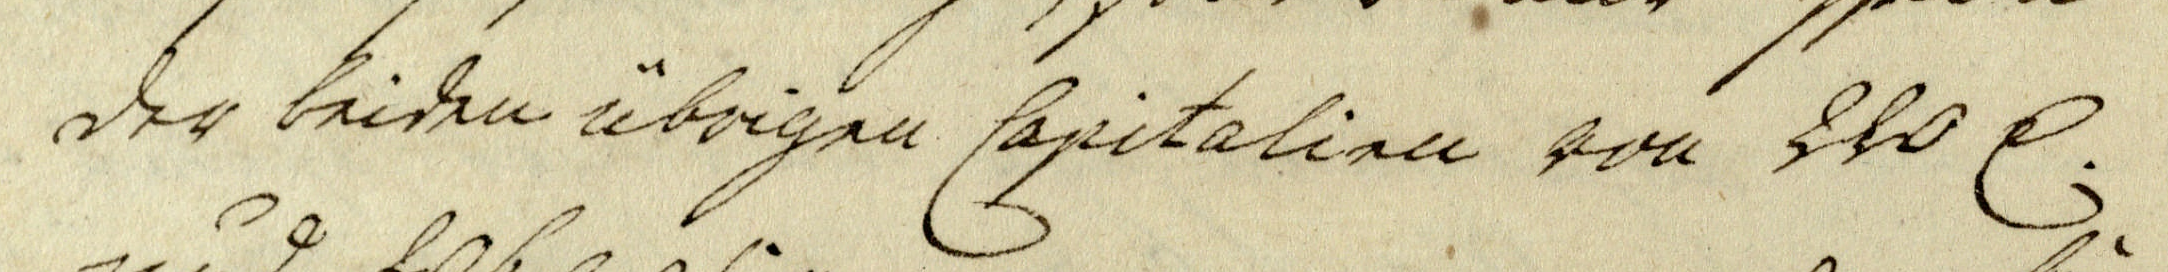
der beiden übrigen Capitalien von 220 l.
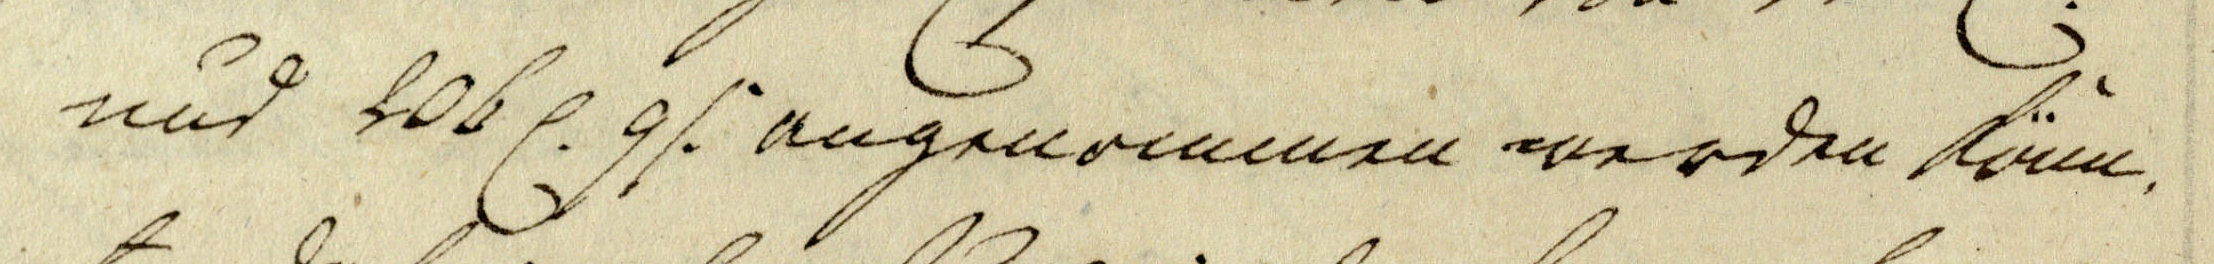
und 206 l. 9 s. angenommen werden könn¬
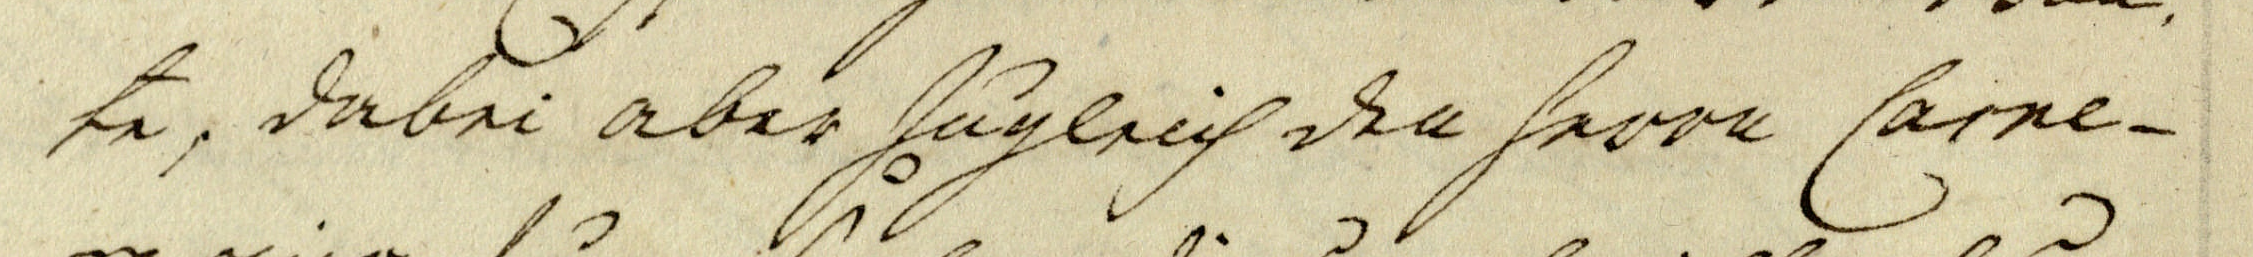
te, dabei aber zugleich den Herrn Came¬
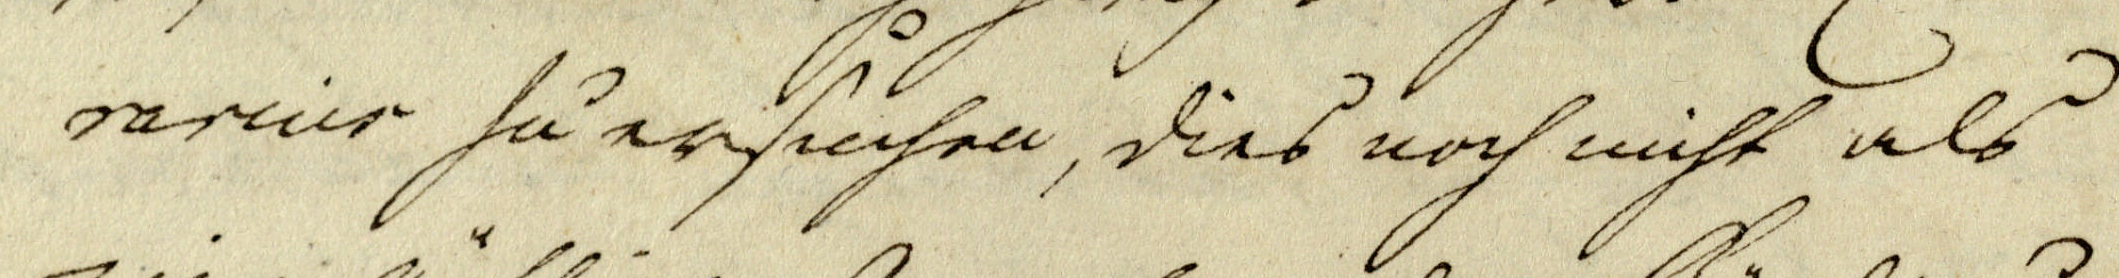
rarius zu ersuchen, dies noch nicht als
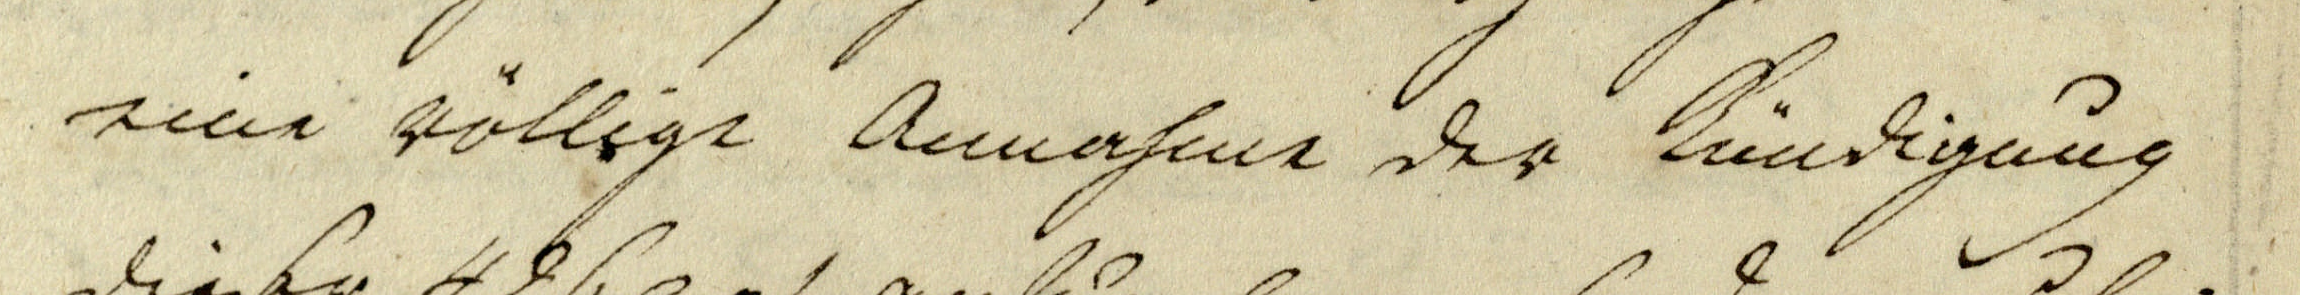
eine völlige Annahme der Kündigung
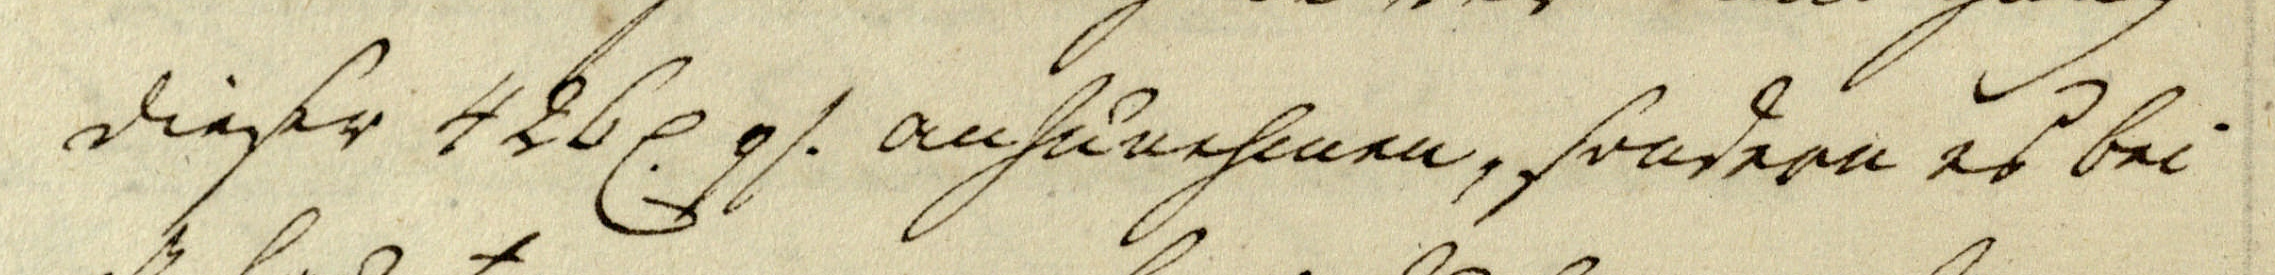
dieser 426 l. 9 s. anzunehmen, sondern es bei
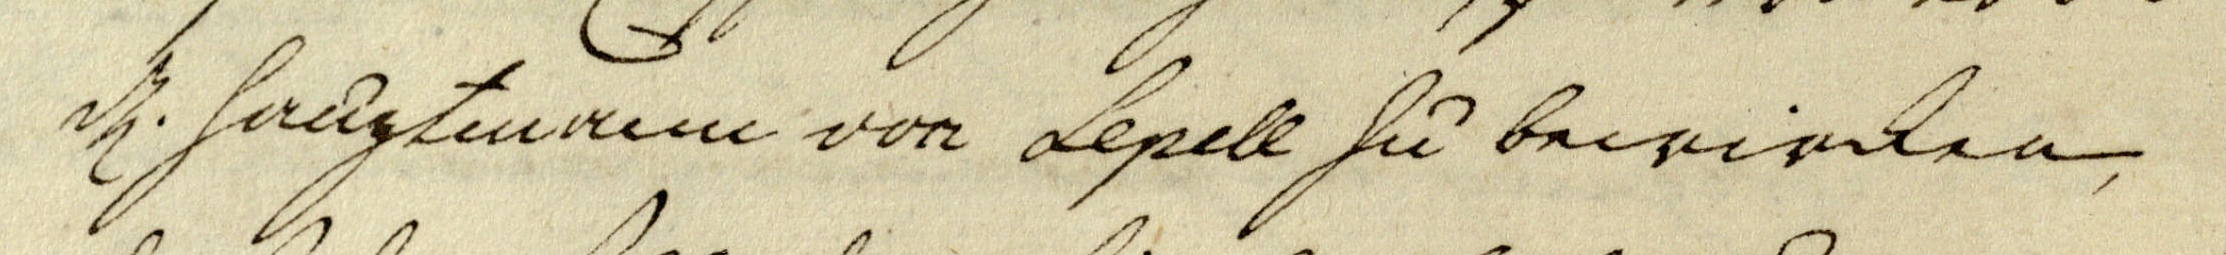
dh. Hauptmann von Lepell zu bewirken,
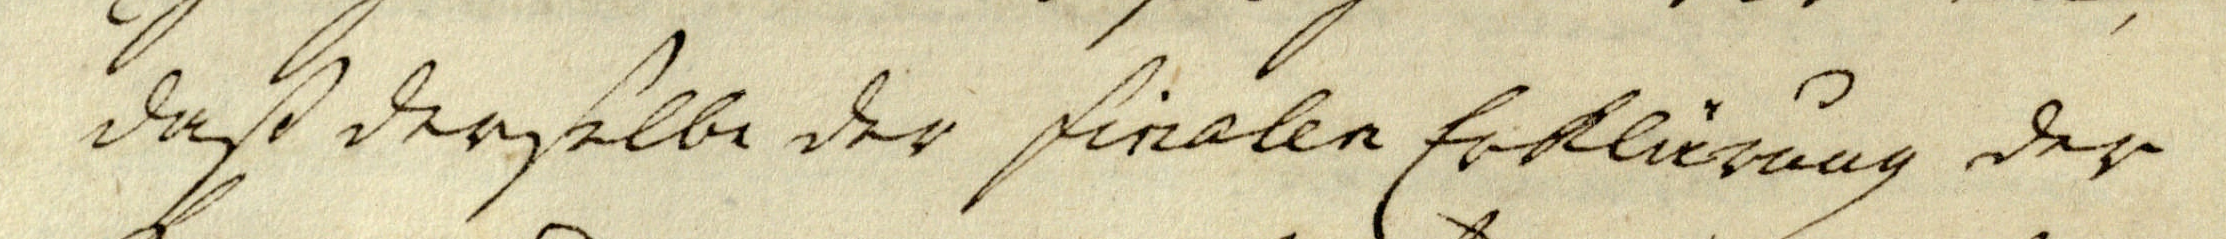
daß derselbe der finalen Erklärung der
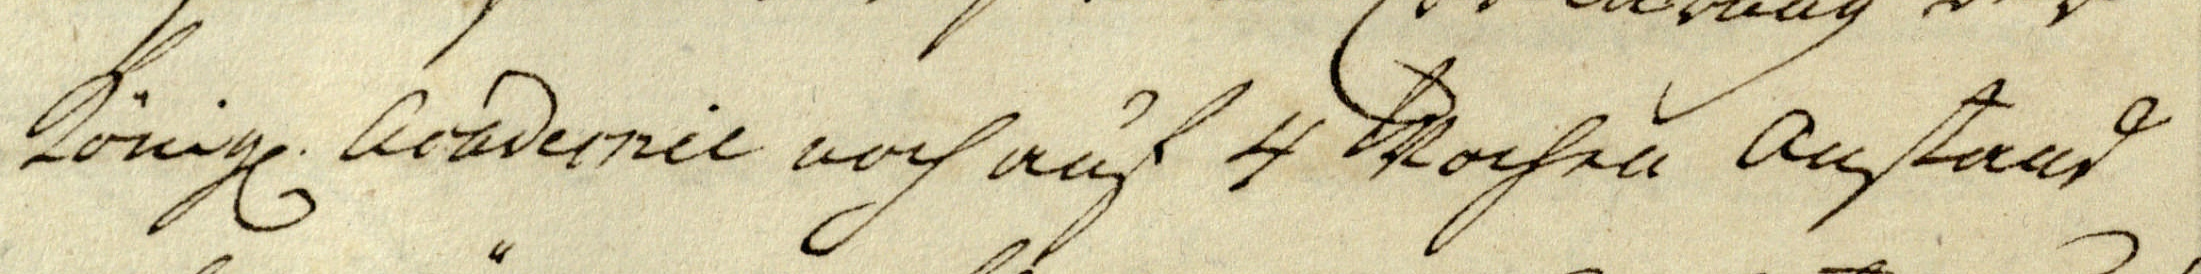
Königl. Academie noch auf 4 Wochen Anstand
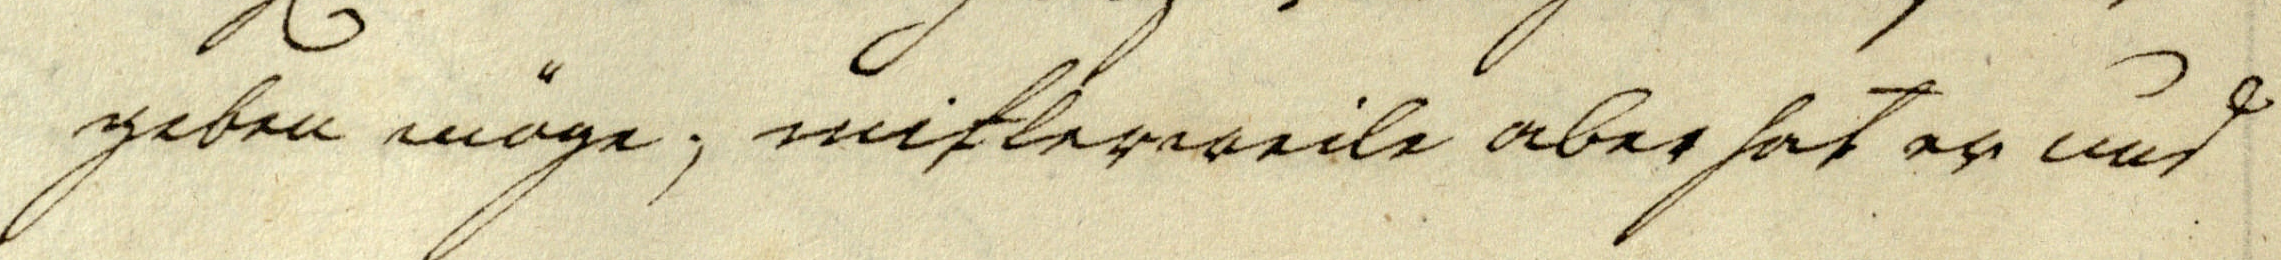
geben möge; mitlerweile aber hat er und
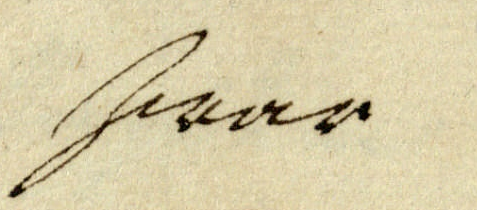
zwar
